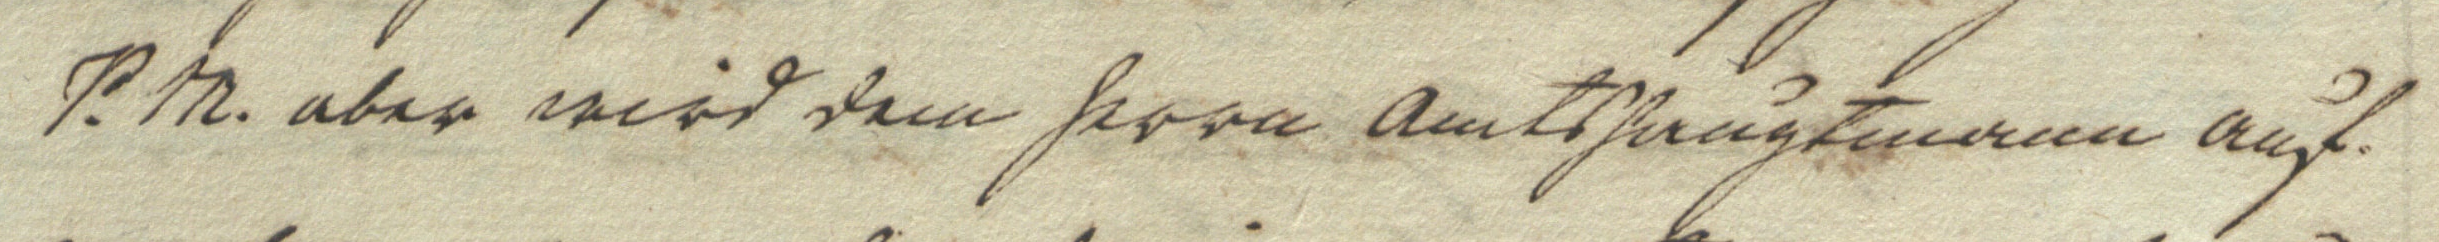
P.M. aber wird dem herrn Amtshauptmann auf¬
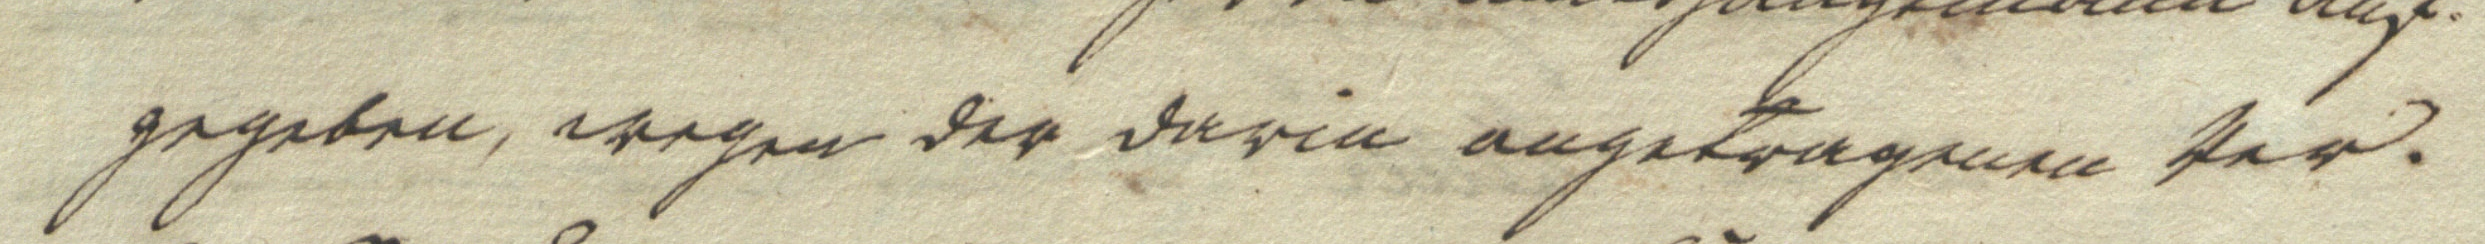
gegeben, wegen der darin angetragenen Ver-
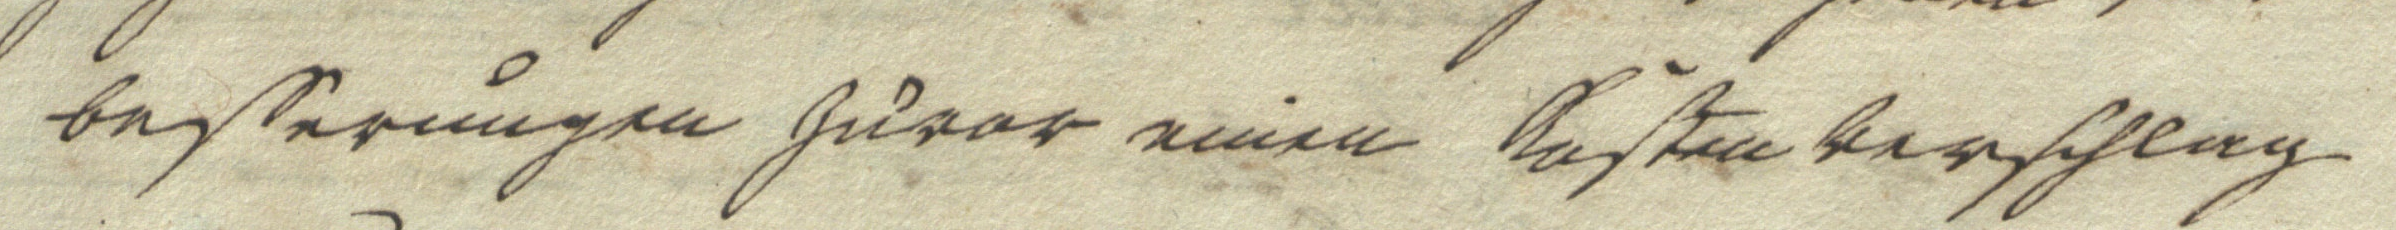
besserungen zuvor einen Kosten Verschlag
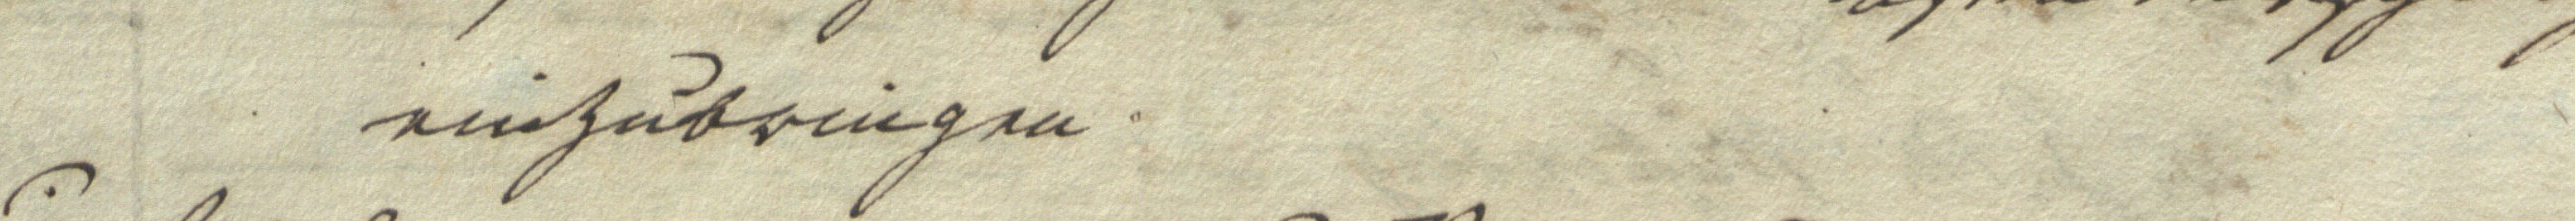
einzubringen.
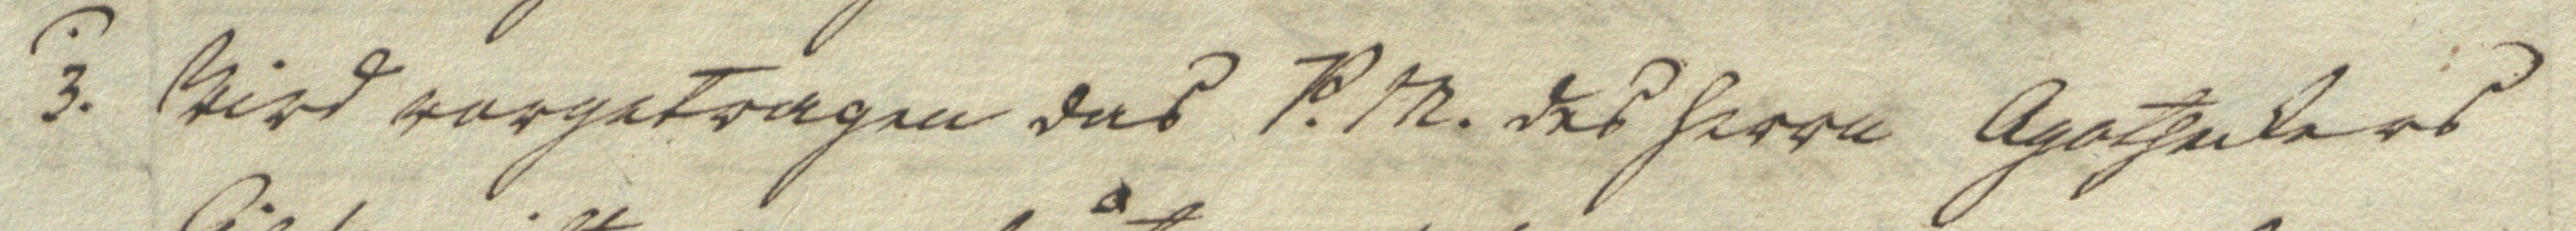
3. Wird vorgetragen das P. M. des Herrn Apothekers
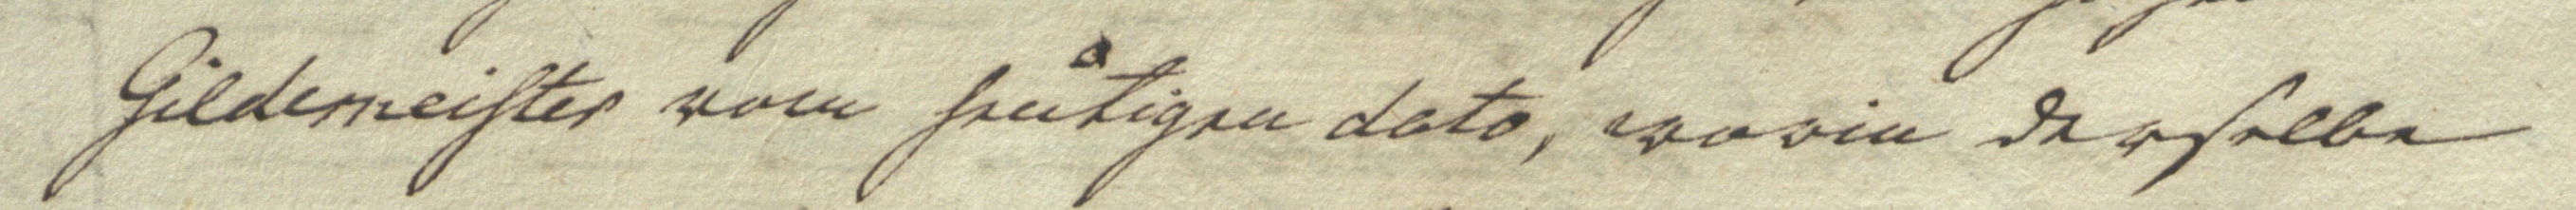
Gildemeister vom heutigen dato, worin derselbe
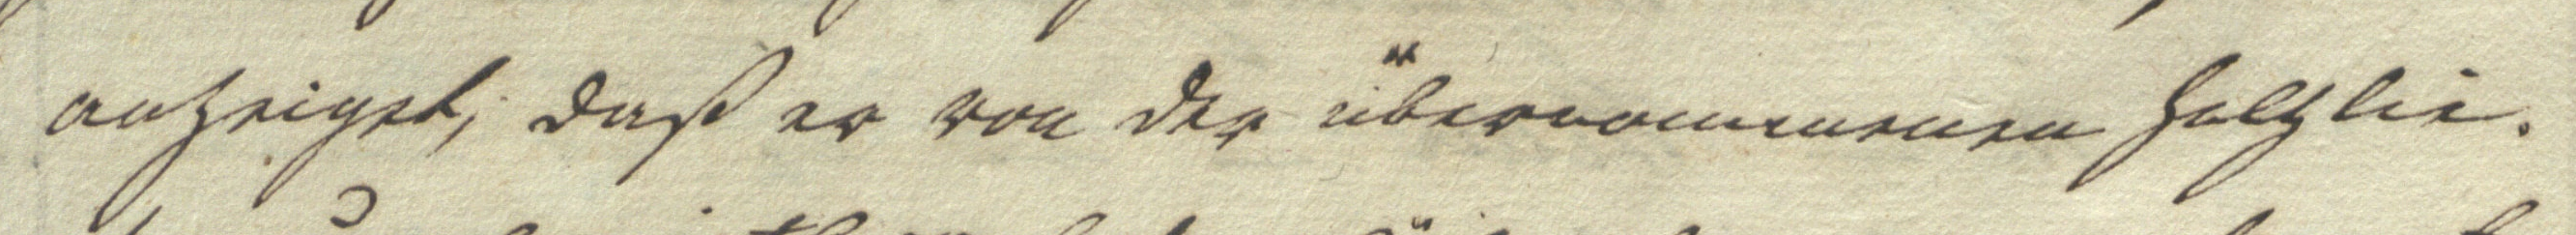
anzeiget, daß er von der übernommenen Holzlie¬
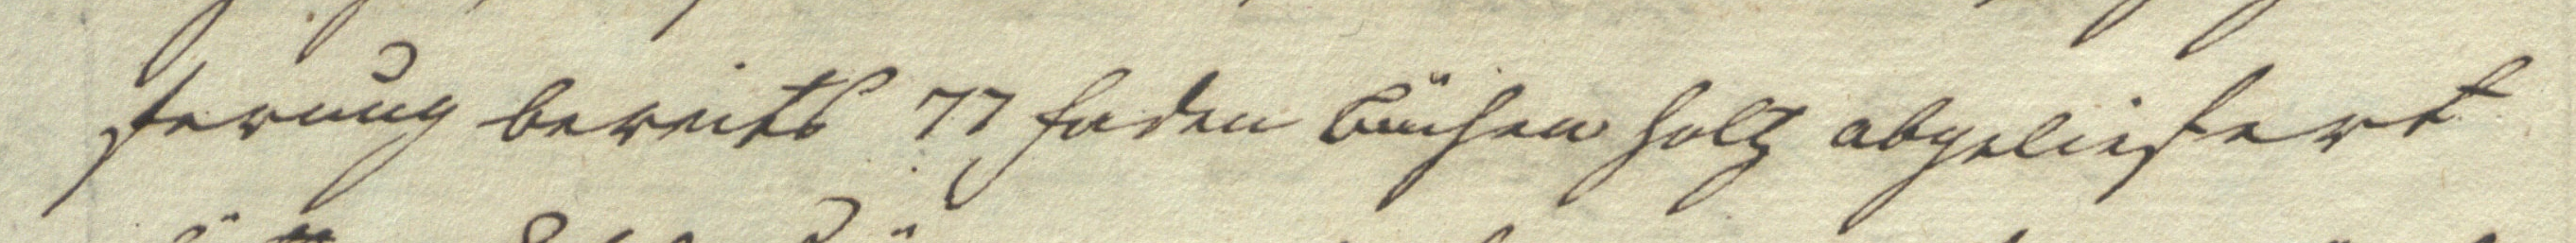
ferung bereits 778 Faden Buchen Holz abgeliefert
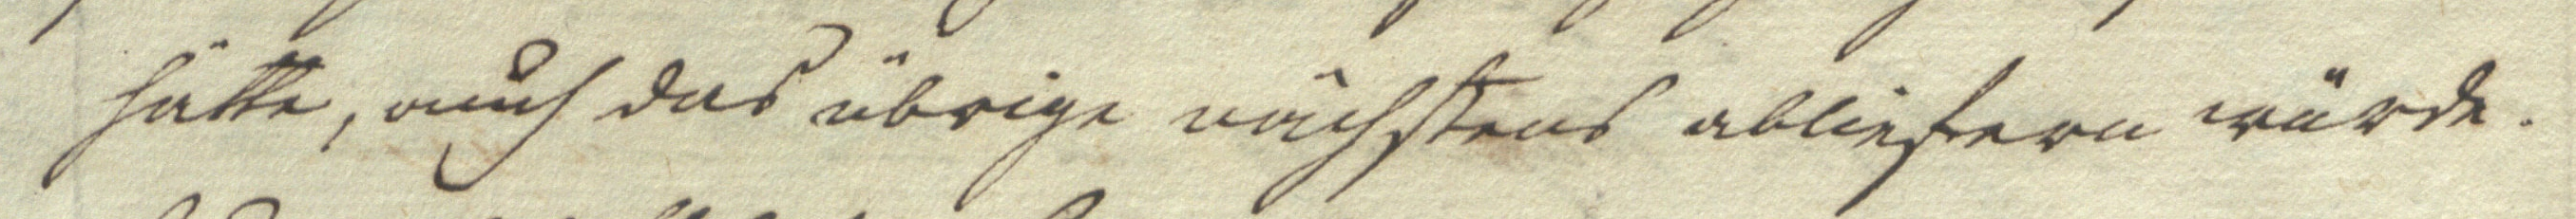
hätte, auch das übrige nächstens abliefern würde.
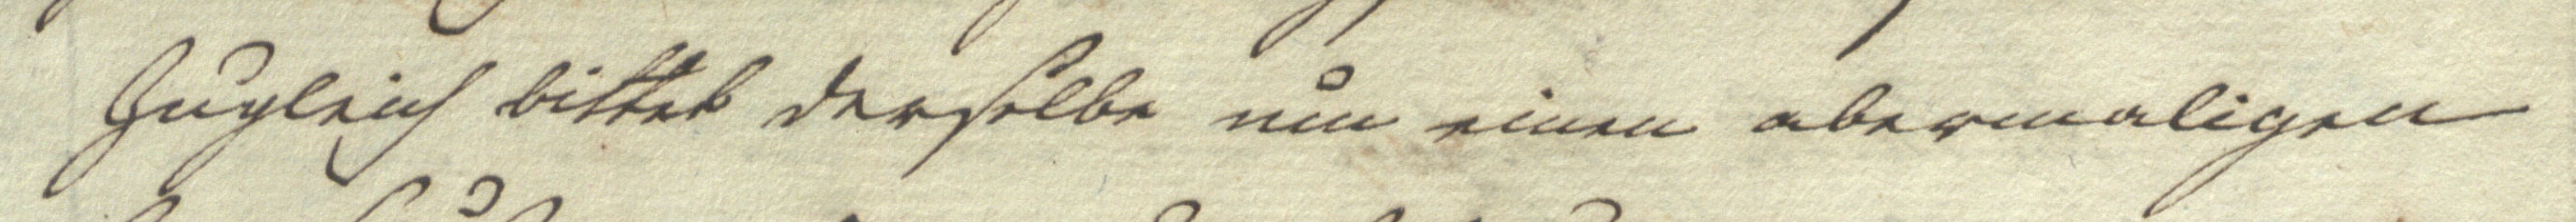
Zugleich bittet derselbe um einen abermaligen
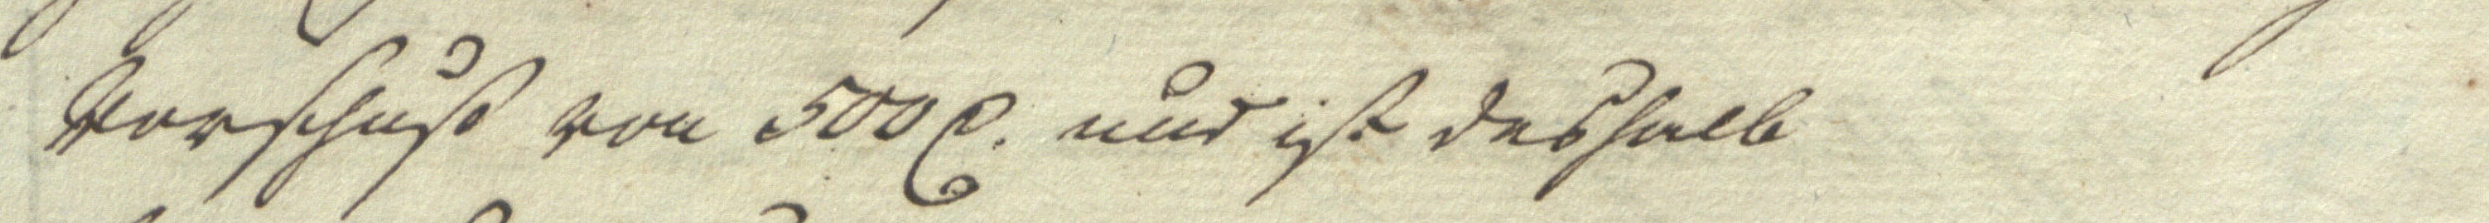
Vorschuß von 500 rtl. und ist deshalb
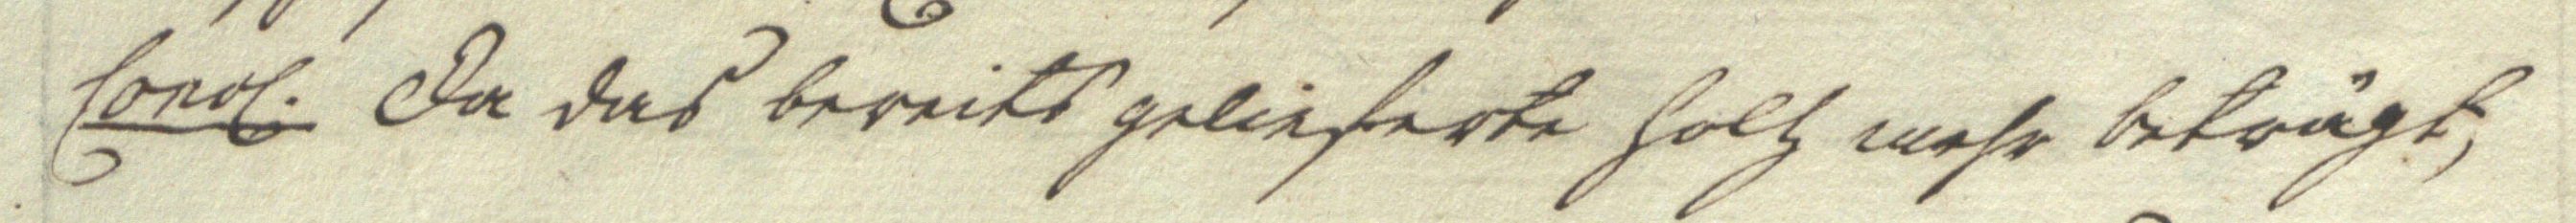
Concl. Da das bereits gelieferte Holz mehr beträgt
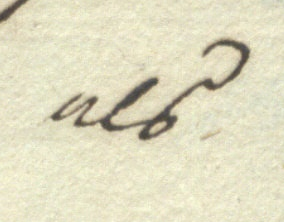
als
